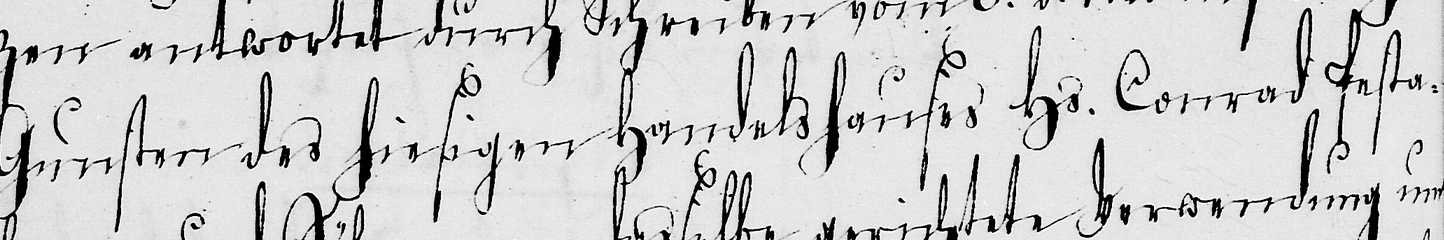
Gunsten des hiesigen Handelshauses Hs. Conrad Pest¬
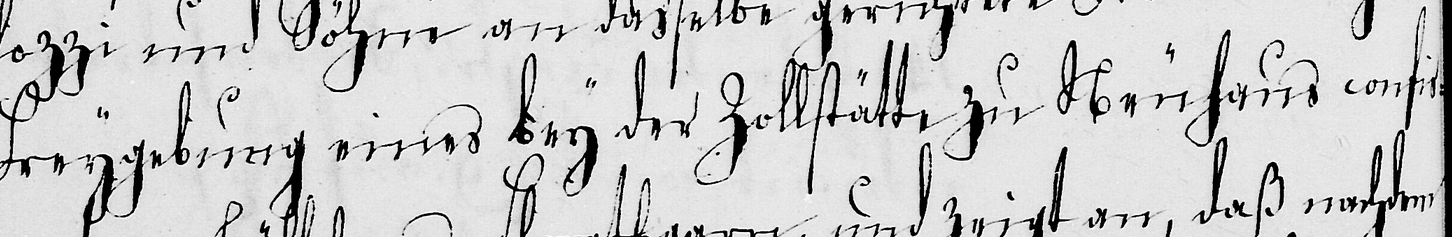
Freygebung eines bey der Zollstätte zu Neuhaus conf¬
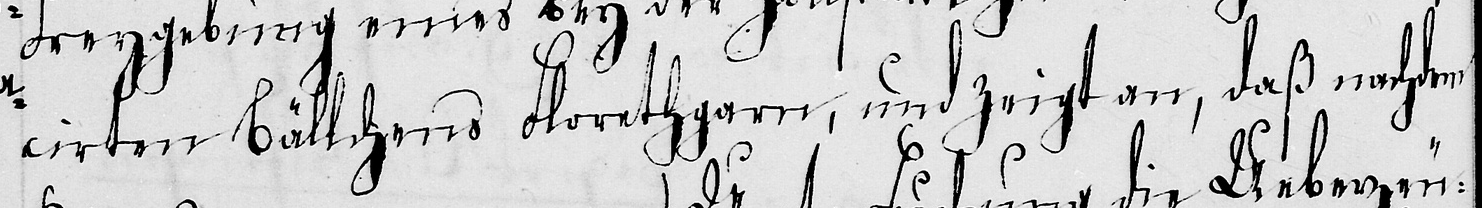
cirten Bällchens Florethgarn, und zeigt an, daß nachdem
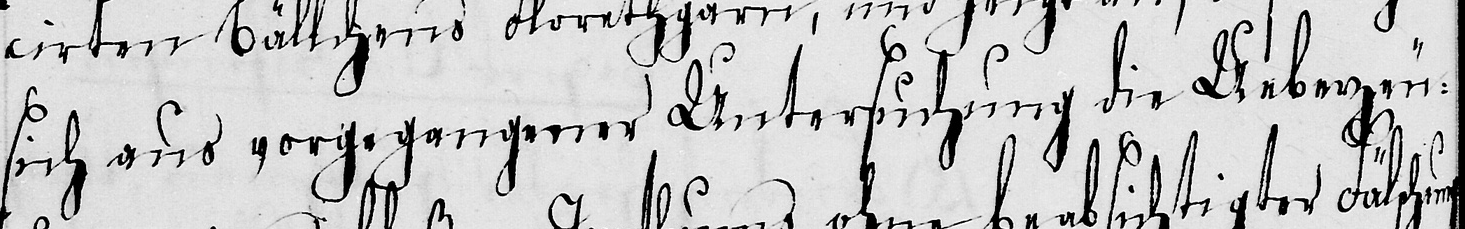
sich aus vorgegangener Untersuchung die Ueberzeu¬
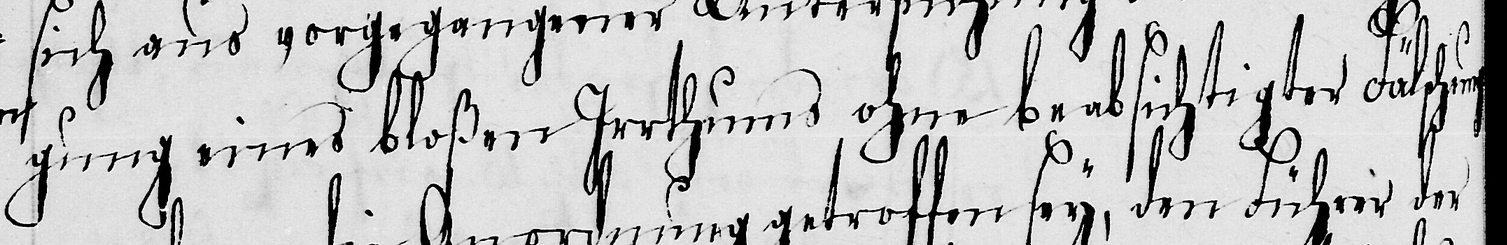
gung eines bloßen Irrthums ohne beabsichtigter Fälsch¬
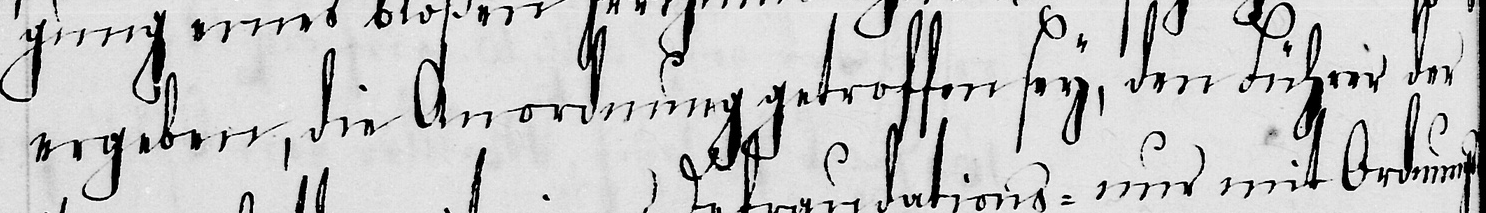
ergeben, die Anordnung getroffen sey, den Führer der
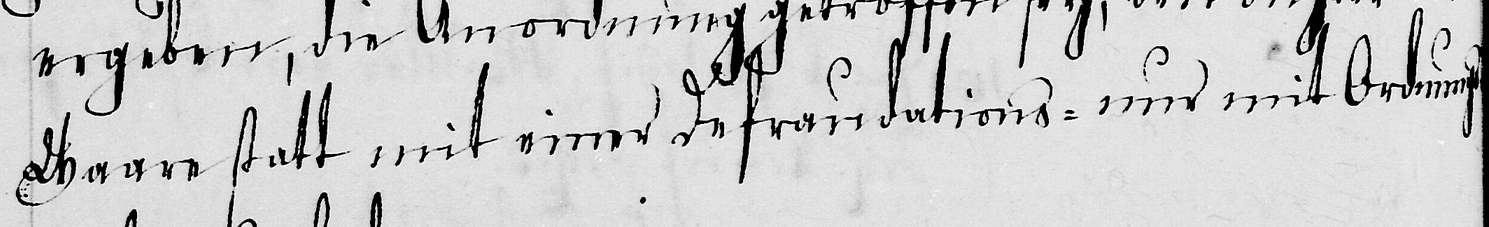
Waare statt mit einer Defraudations- nur mit Ordnun¬
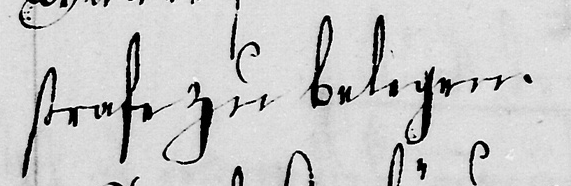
strafe zu belegen.
